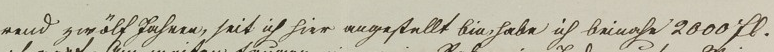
rend zwölf Jahren, seit ich hier angestellt bin, habe ich beinahe 2000 fl.
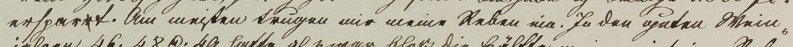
erspart. Am meisten trugen mir meine Reben ein. In den guten Wein-
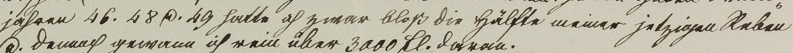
jahren 46. 48 &. 49 hatte ich zwar bloß die Hälfte meiner jetzigen Reben
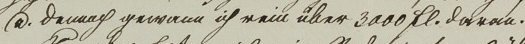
&. dennoch gewann ich rein über 3000 fl. daran.
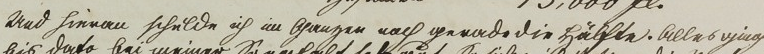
Und hieran schulde ich im Ganzen noch gerade die Hälfte. Alles ging
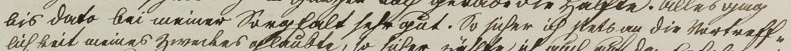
bis dato bei meiner Sorgfalt sehr gut. So sicher ich stets an die Vortreff-
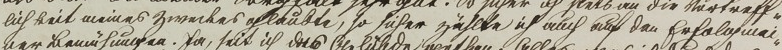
lichkeit meines Zweckes glaubte, so sicher zählte ich auch auf den Erfolg mei-
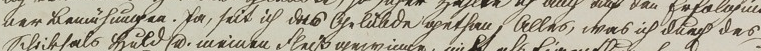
ner Bemühungen. Ja, seit ich das Gelübde gethan, Alles, was ich durch des
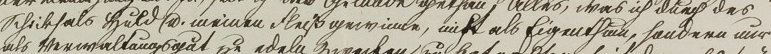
Schicksals Huld &. meinen Fleiß gewinnen, nicht als Eigenthum, sondern nur
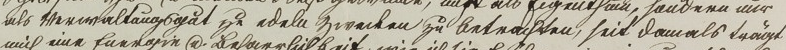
als Verwaltungsgut zu edeln Zwecken zu betrachten, seit damals trägt
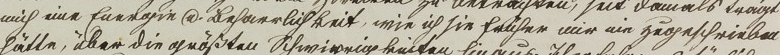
mich eine Energie &. Beharrlichkeit, wie ich sie früher mir nie zugeschrieben
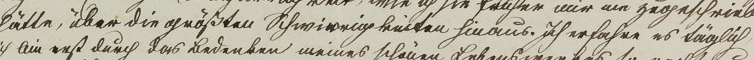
hätte, über die größten Schwirigkeiten hinaus. Ich erfahre es täglich,
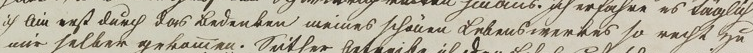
ich bin erst durch das Bedenken meines schönen Lebenswerkes so recht zu
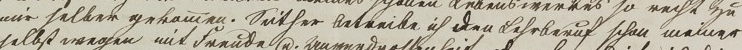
mir selber gekommen. Seither betreibe ich den Lehrberuf schon meiner
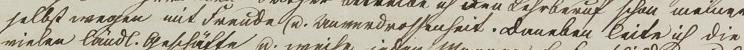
selbst wegen mit Freude &. Unverdrossenheit. Daneben leite ich die
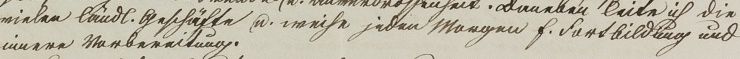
vielen ländl. Geschäfte &. weihe jeden Morgen f. Fortbildung und
